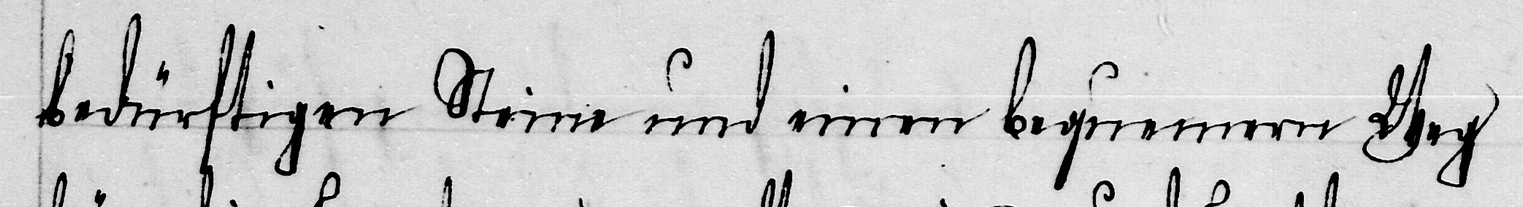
bedürftigen Steine und einen bequemern Weg
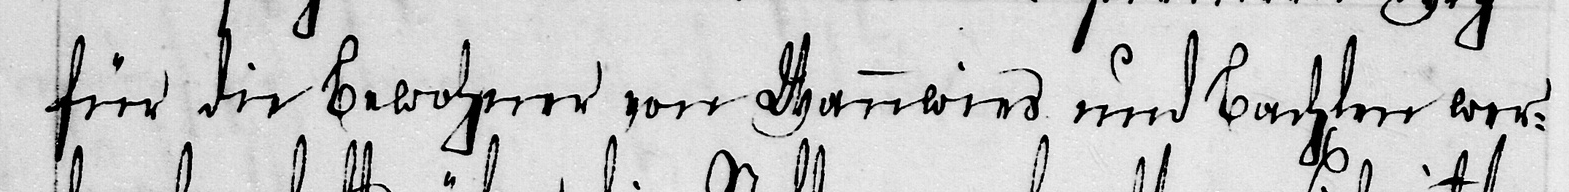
für die Bewohner von Wannwies und Bachlen wer¬
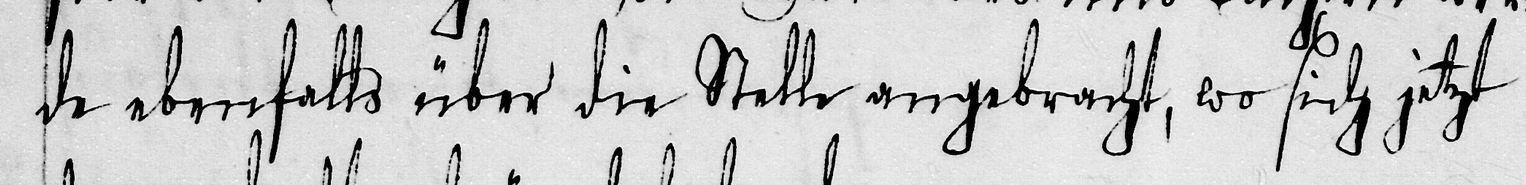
de ebenfalls über die Stelle angebracht, wo sich jetzt
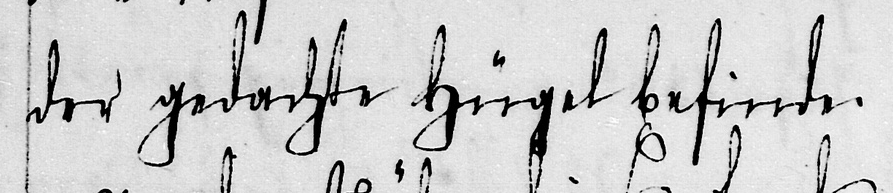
der gedachte Hügel befinde.
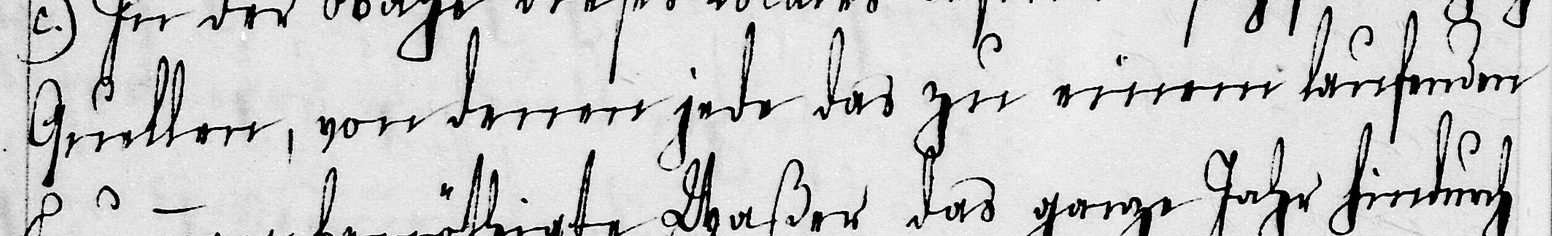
Quellen, von denen jede das zu einem laufenden
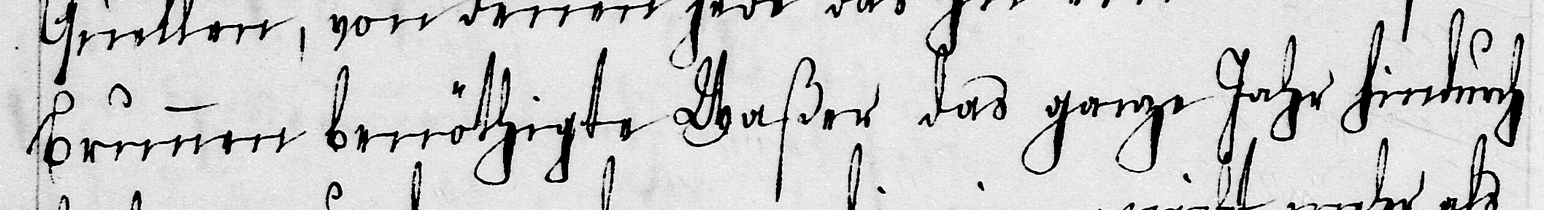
Brunnen benöthigte Waßer das ganze Jahr hindurch
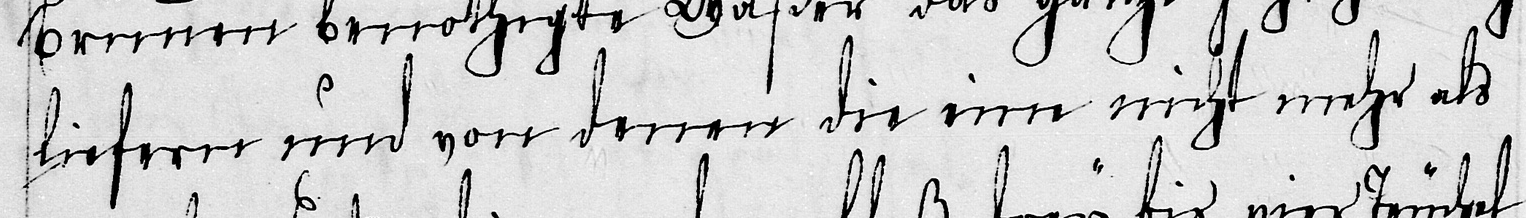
liefern und von denen die eine nicht mehr als
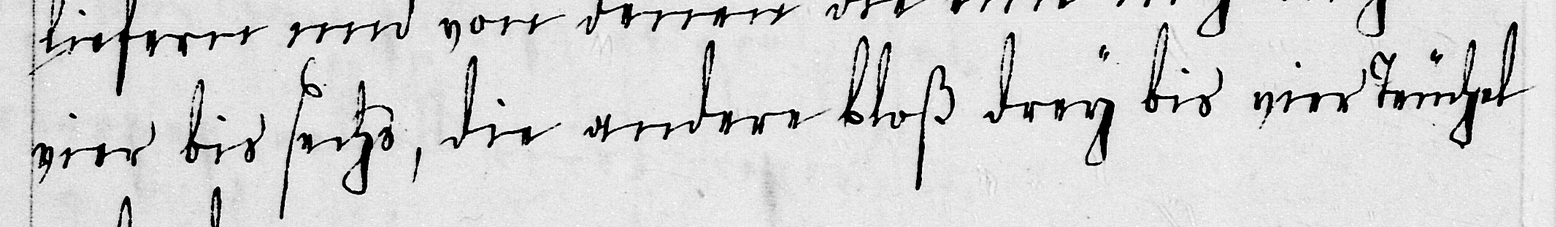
vier bis sechs, die andere bloß drey bis vier Teuchel
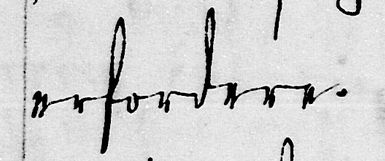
erfordere.
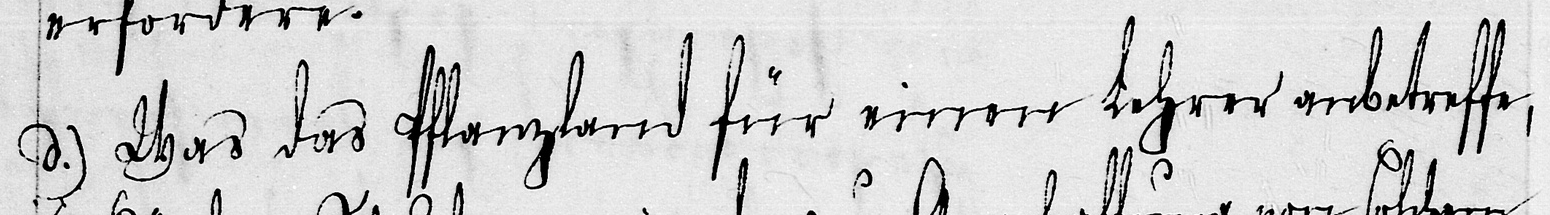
d.) Was das Pflanzland für einen Lehrer anbetref¬
